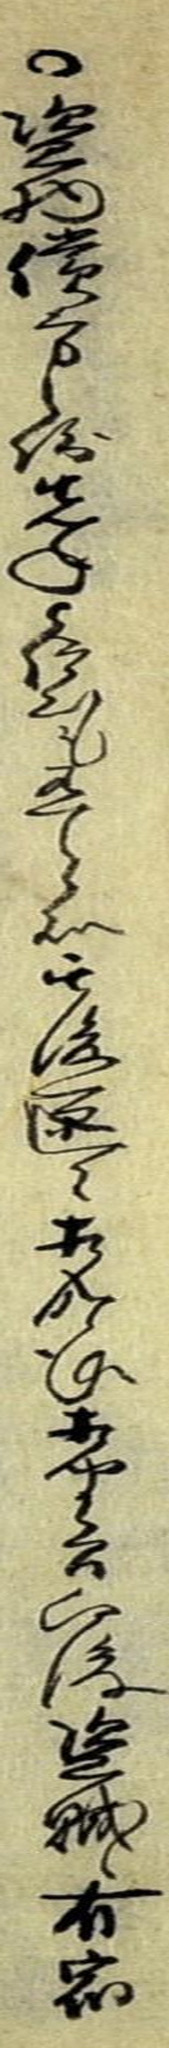○盗物償方之儀先年被仰出も有之候処其後区々相成候趣相聞候間向後盗賊之有宿
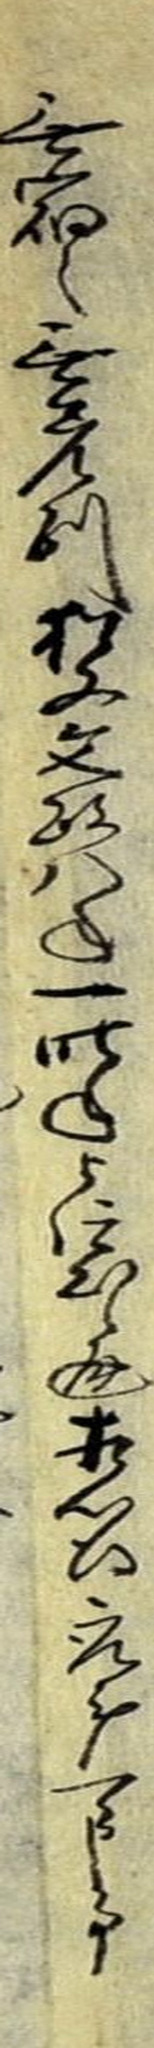無宿之無差別猶又文政八年一昨年被仰出之通相心得取計可申事
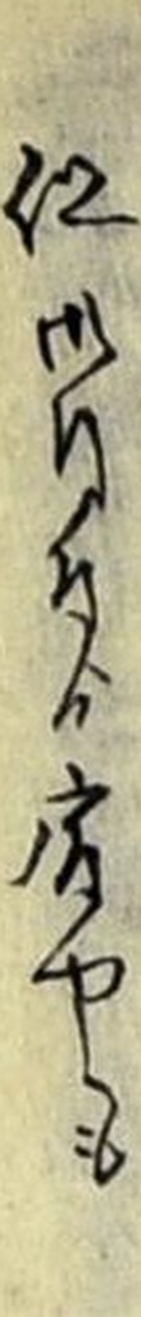但御目付ゟ府中へも

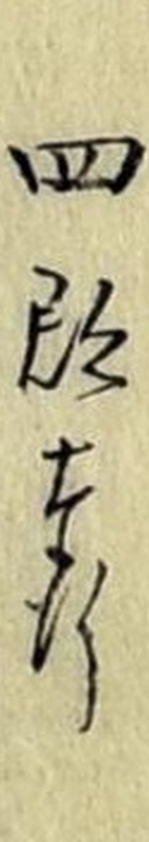四郡奉行
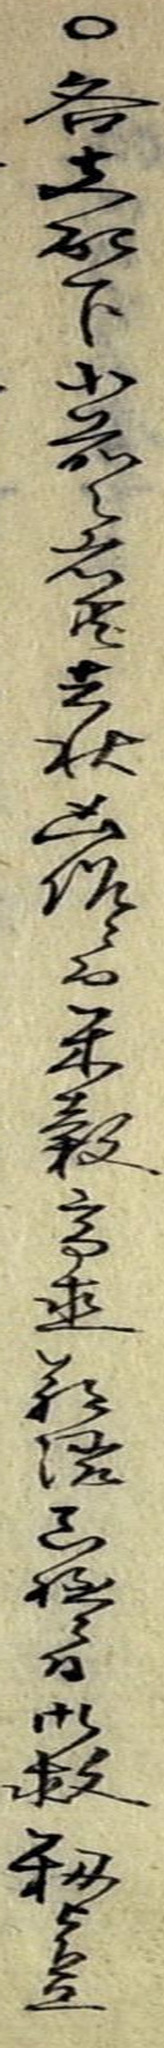○各支配下小前之者共去秋凶作ニ而米穀高直難渋至極ニ付御救籾被下置
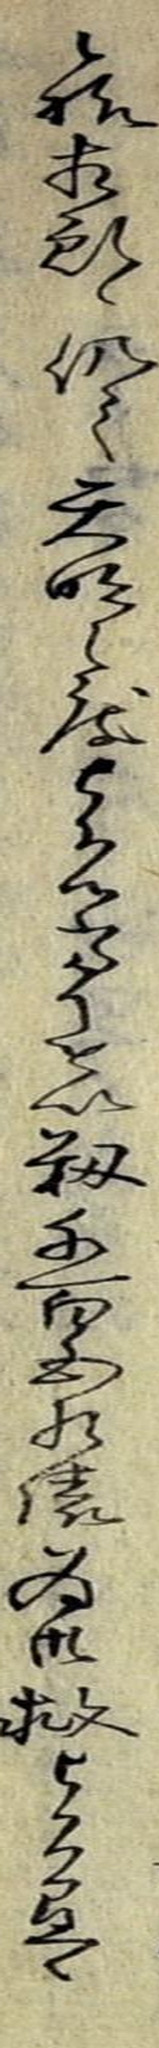候様相願候仍之天明之度被下候当りを以籾千百五拾俵為御救被下置候
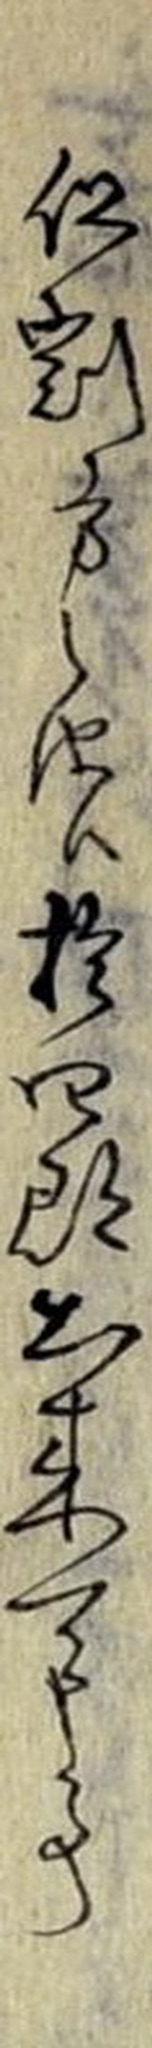但割方之儀ハ於四郡出来可申事
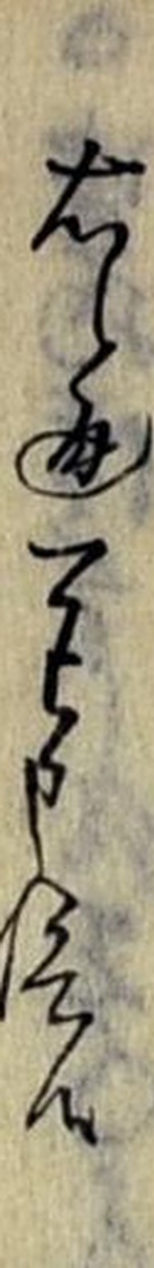右之通可被申渡候
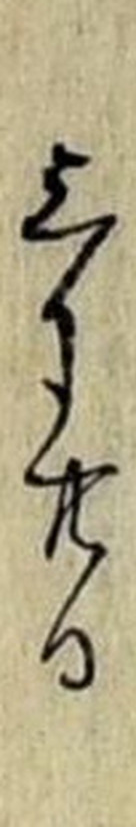三月廿日
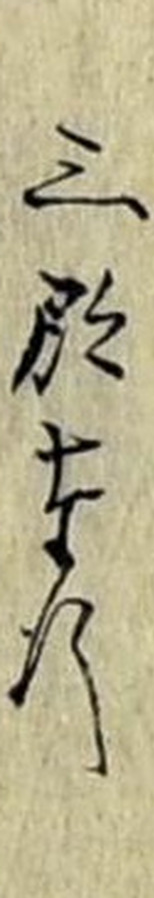三郡奉行
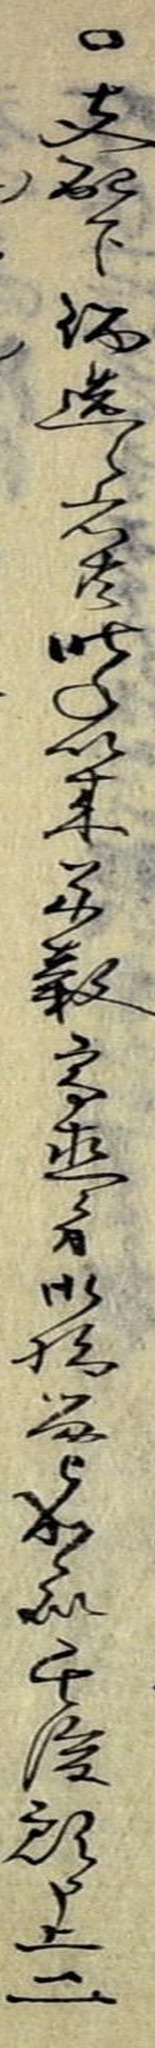○支配下酒造之者共昨年以来米穀高直ニ付御指留被成候処其後願申上二
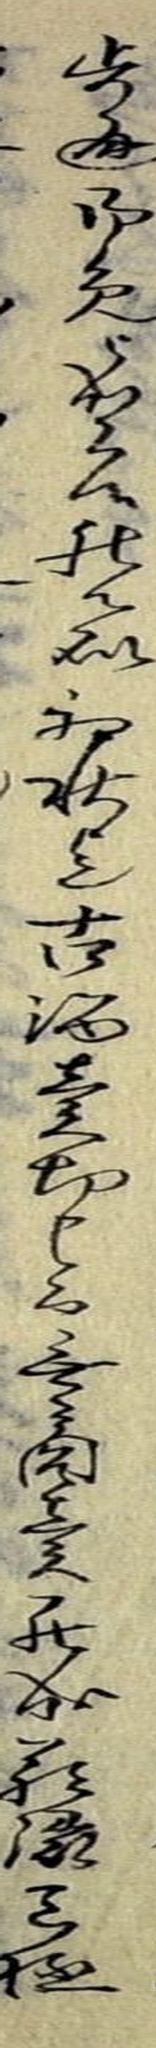歩通御免被成下候然ル処初秋迄古酒売切申候而無商売罷成難渋至極
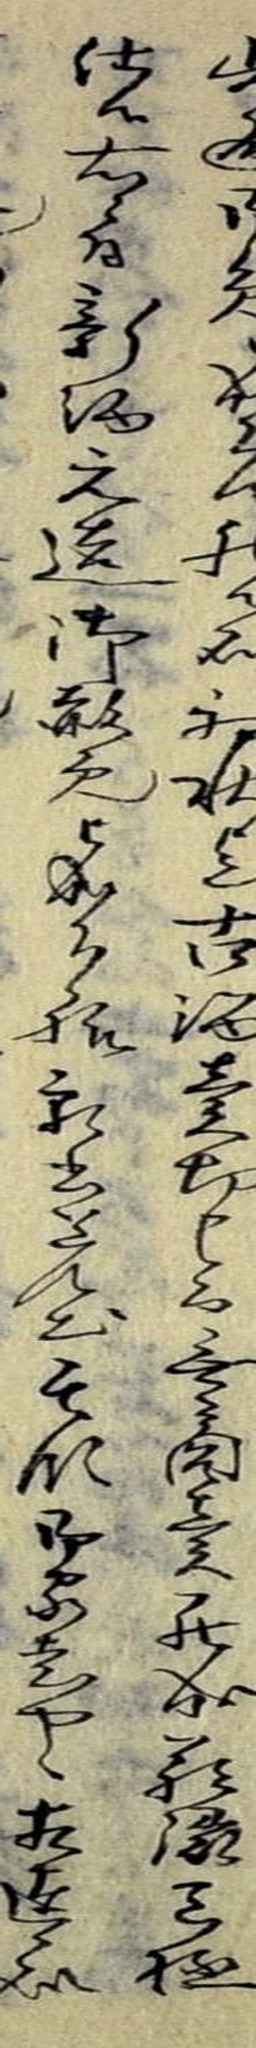仕候右ニ付新酒元造御赦免被成下候様願書差出其段御家老中へ相達候処
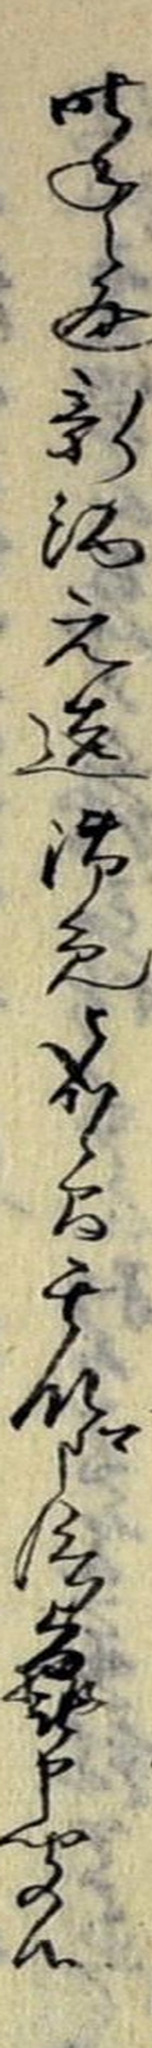昨年之通新酒元造御免被成候間其段可申渡旨被申聞候
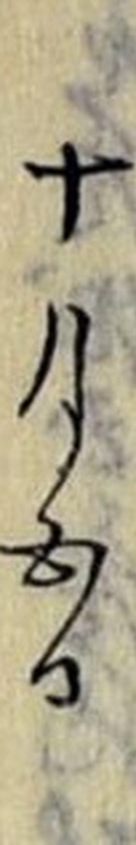十月五日
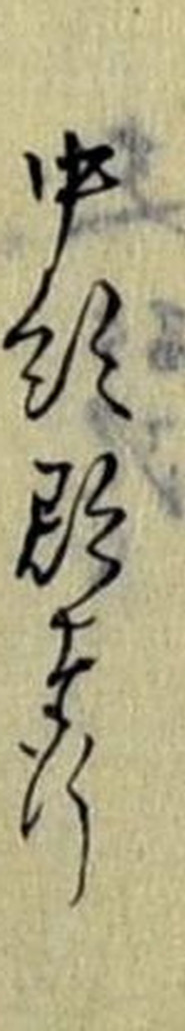中領郡奉行
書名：命令之部 五
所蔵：福井県文書館 Fukui Prefectural Archives
